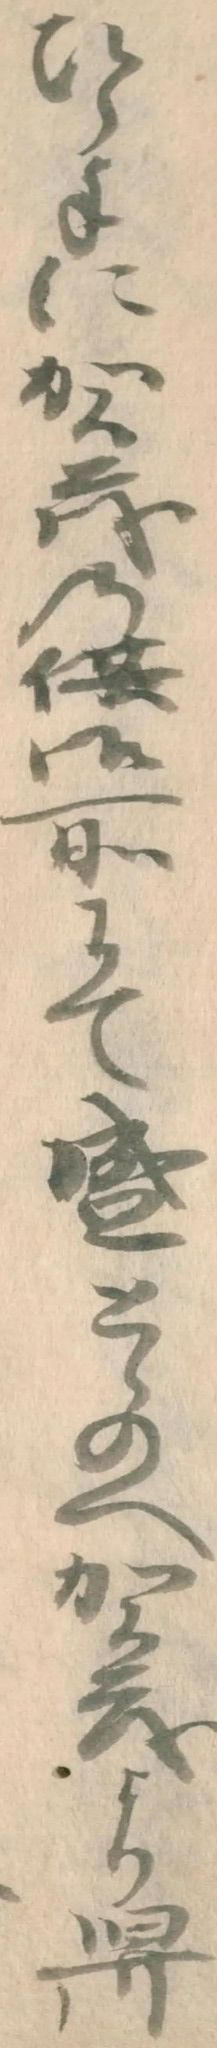ひら手に賀茂の供御所にて盛とゝのへ賀茂より舁-
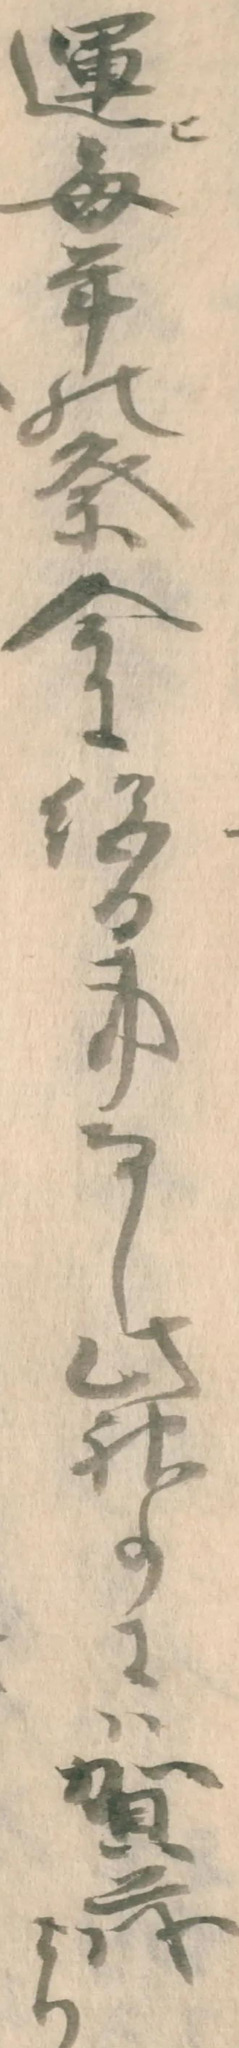運毎年の祭今に絶る事なし此神事には賀茂より
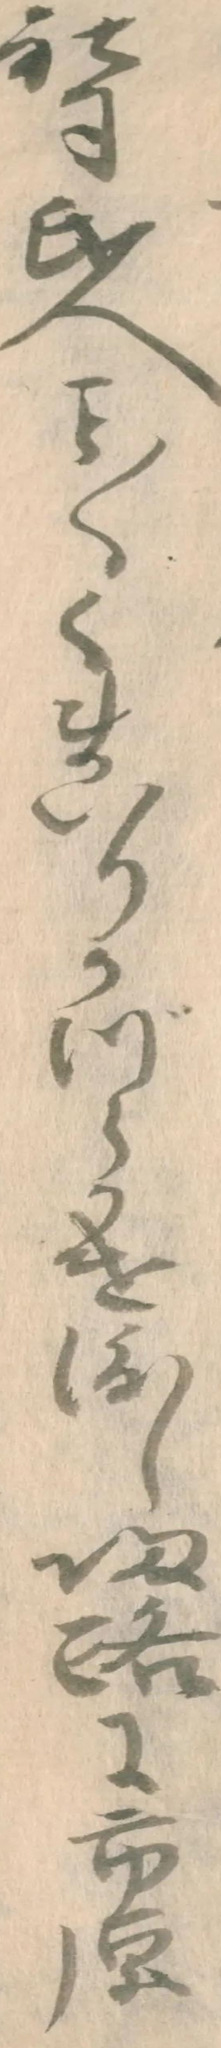社司氏人こと〳〵くまいりかづらかけ渡し帰路に市原
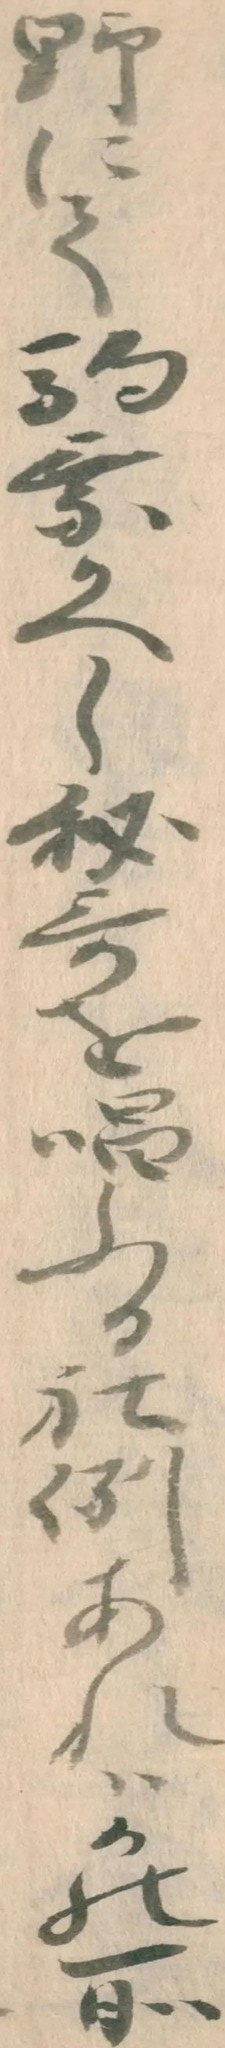野にて駒乗かへし秘哥を唱ふる社例あれはかの所
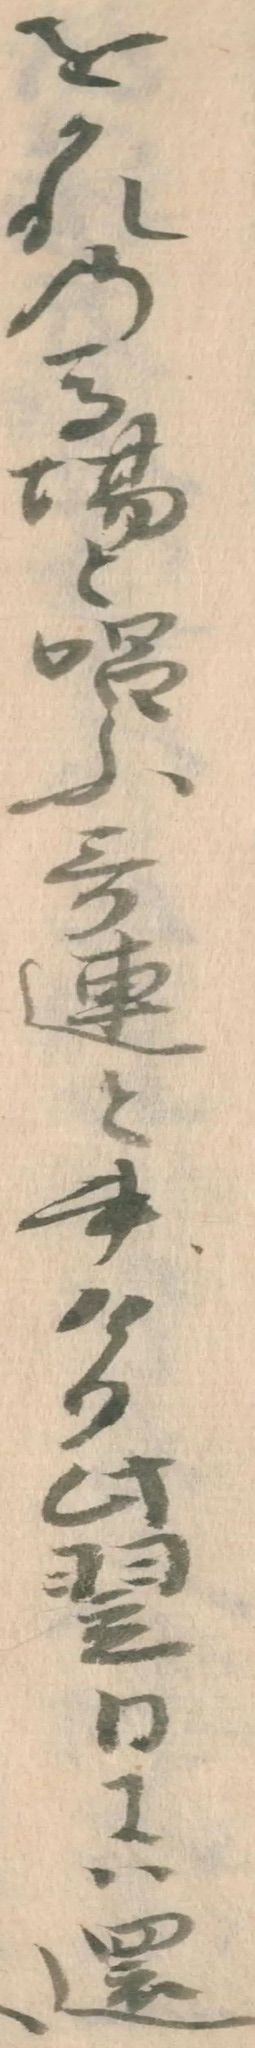をかれの馬場と唱ふ哥連と書けり此翌日には還
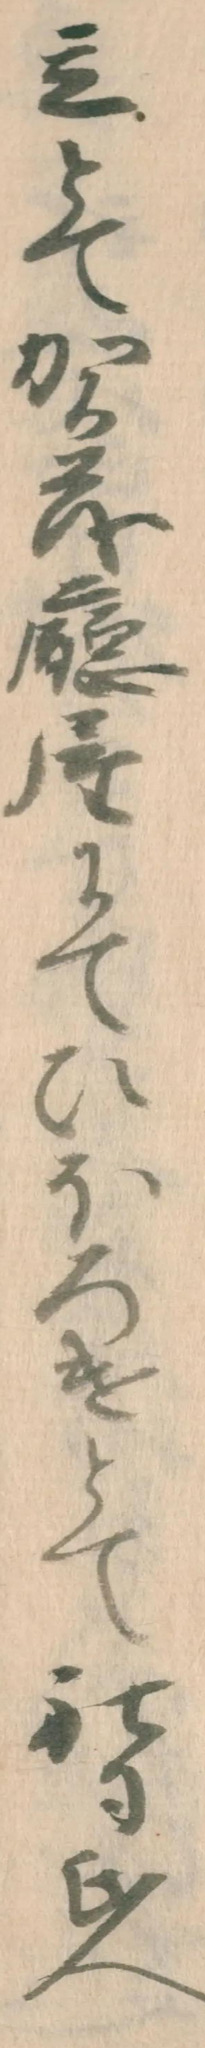立とて賀茂庁屋にてひほろけとて社司氏人
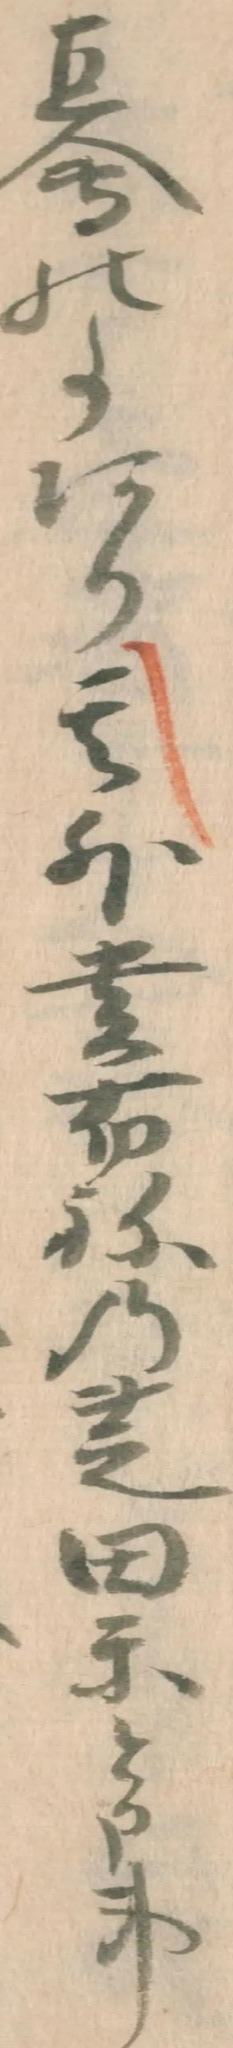直会の事あり其外貴ふねの芝田楽と申事
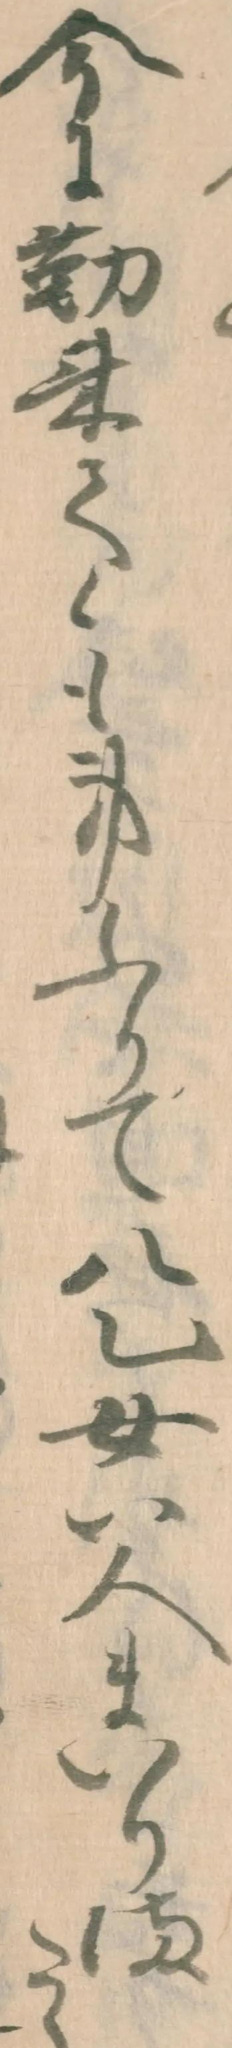今に勤来て候も事ふりて八乙女八人まいりまたら
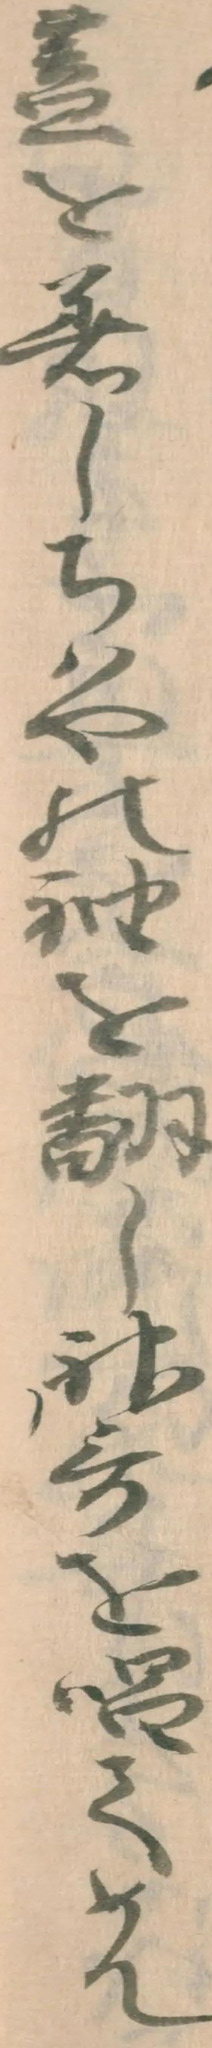蓋を着しちはやの袖を翻し神-哥を唱てめて
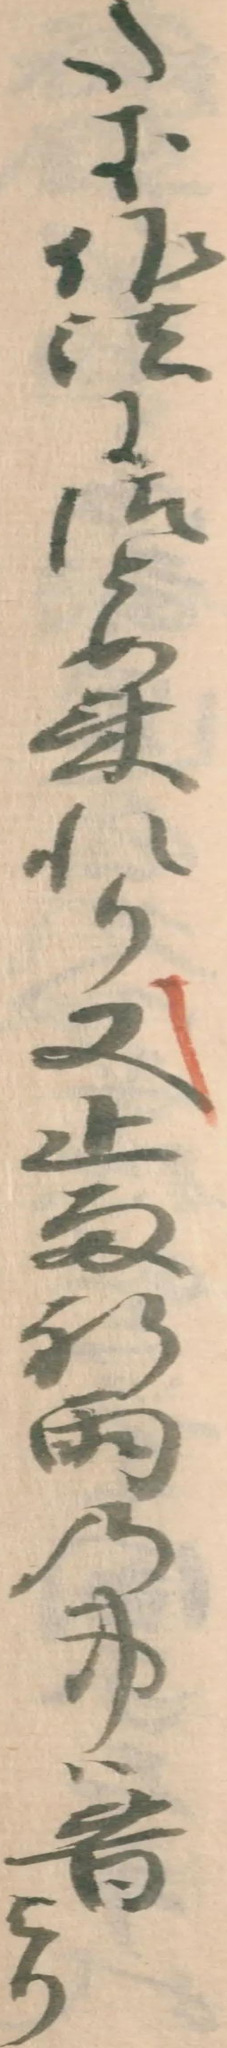たき作法につとめ来れり又止雨祈雨の事は昔より
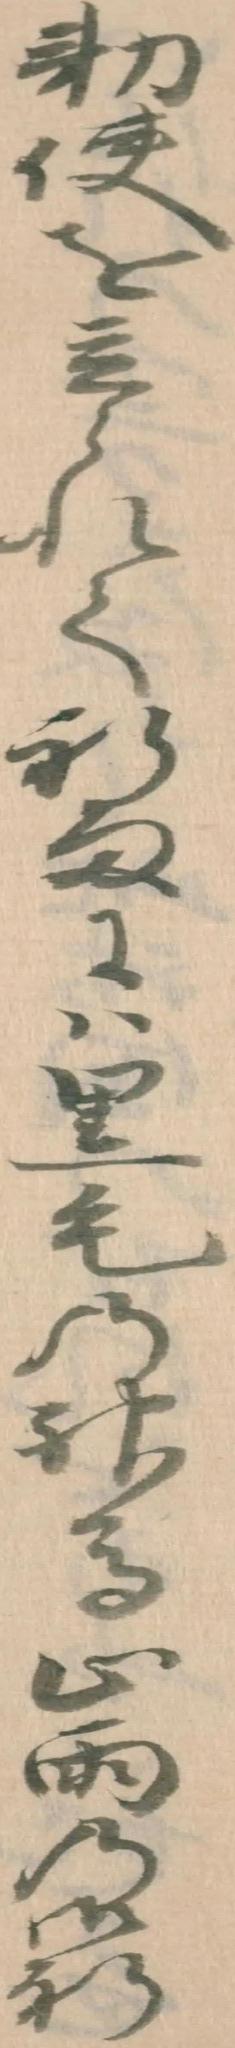勅使を立られて祈雨には黒毛の神馬止雨の御祈
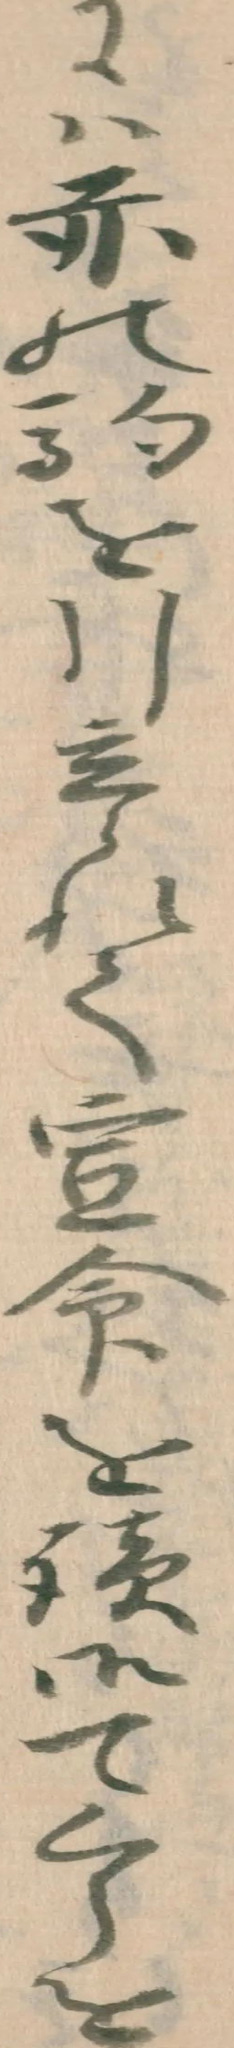には赤の駒を引立られて宣命を読御てくらを
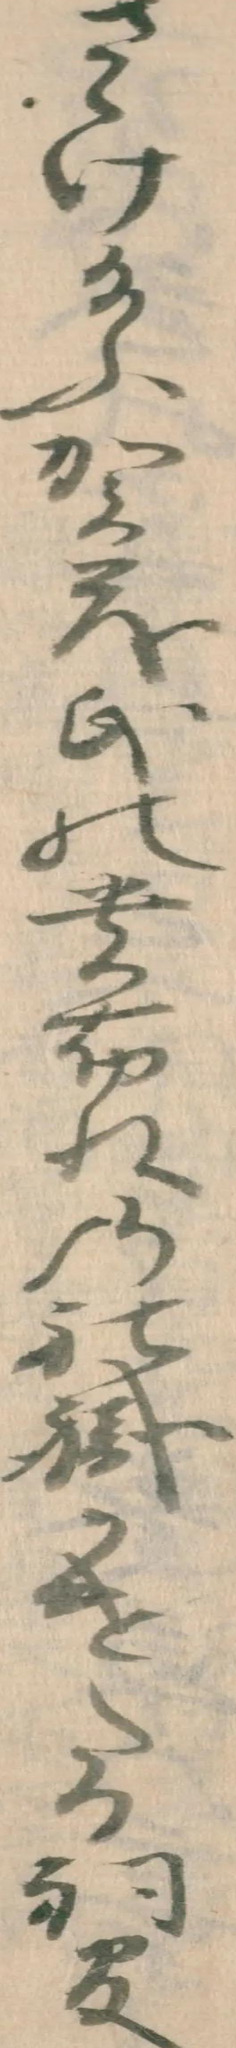さゝけ給ふ賀茂氏の貴ふねの社職かけたる祠官
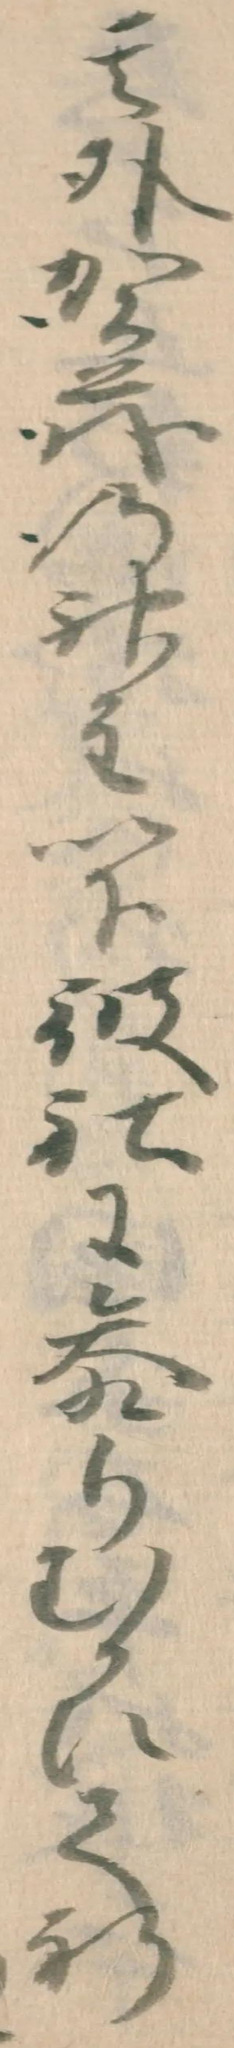其外賀茂の神主以下彼社に参りむかひて祈り
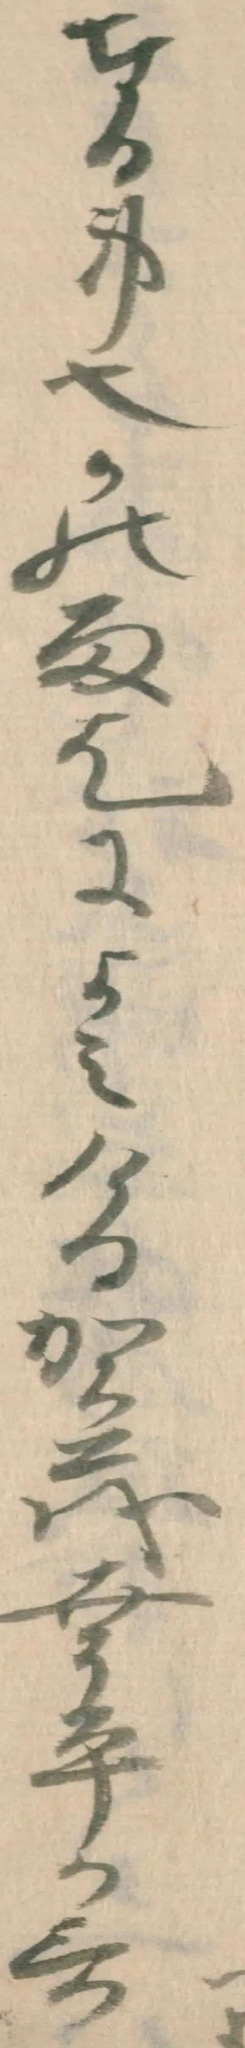奉る事也かの雨乞によみける賀茂幸平か哥
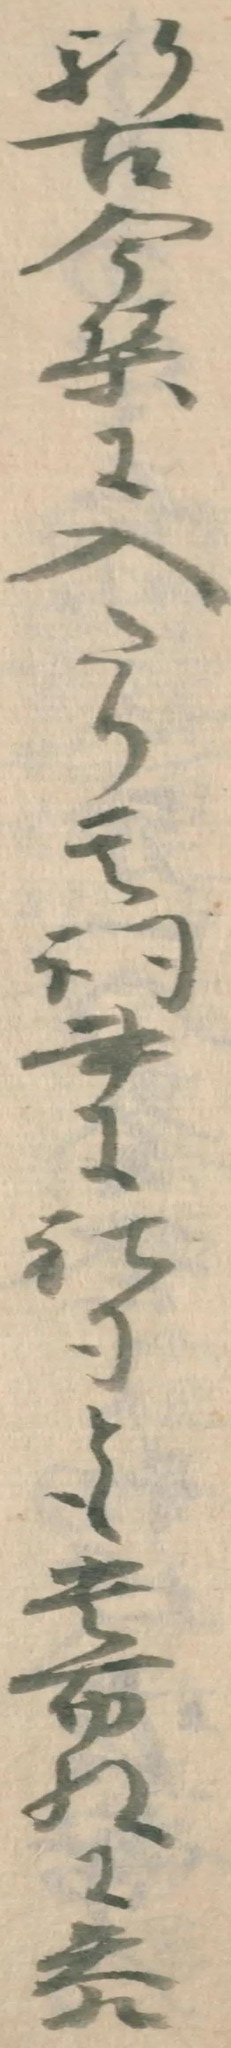新古今集に入たり其詞書に社司とも貴ふねに参
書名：賀茂社記録. 第1冊
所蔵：国立国会図書館 National Diet Library, JAPAN
